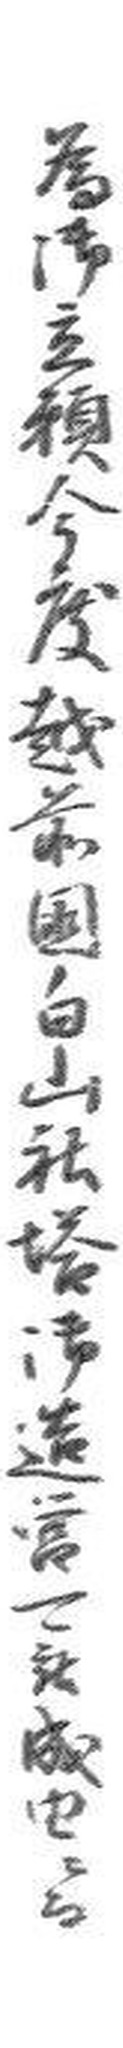為御立願今度越前国白山社塔御造営荷被成由ニ而
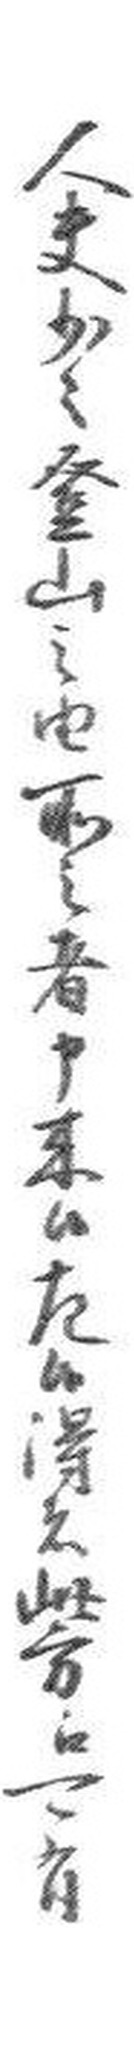人夫少々登山之由所之者申来候左候得者此方江可有
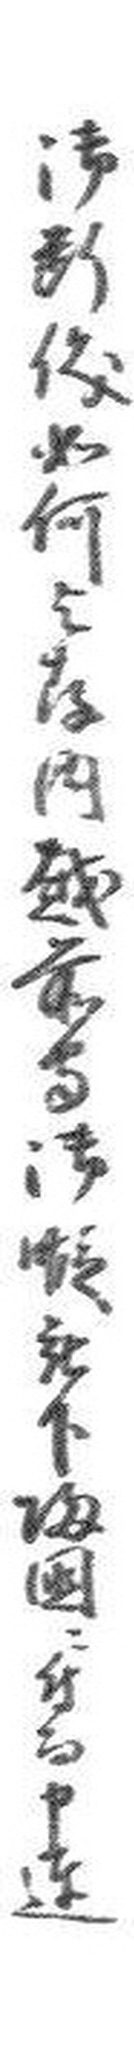御断儀如何与存内越前守御暇被下帰国ニ付而申達
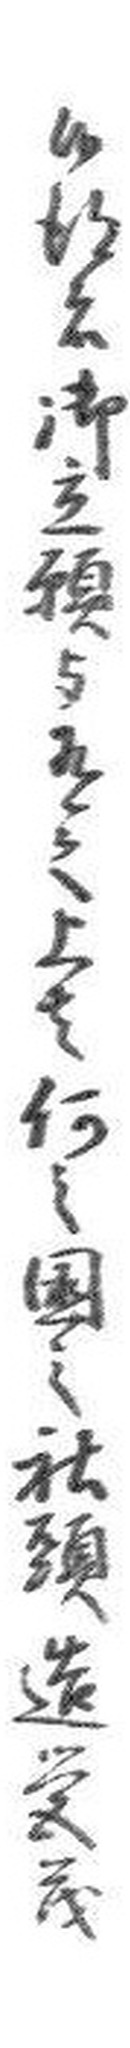候得共御立願与有之上者何之国之社頭造営茂
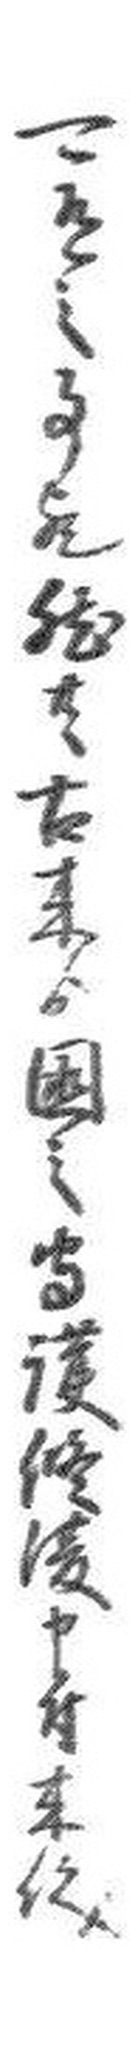可有之事歟然共古来ゟ国之守護修復申付来儀
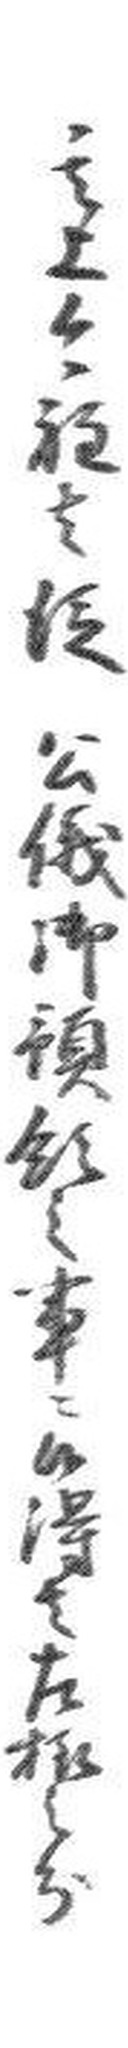其上今程者従公儀御預領之事ニ候得者左様之分

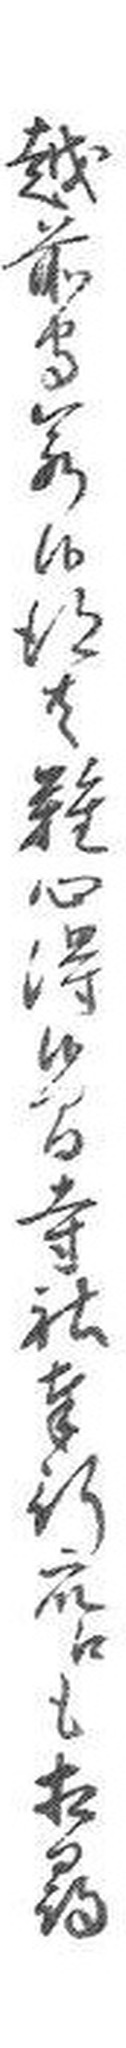越前守若候得共難心得候間寺社奉行衆江も相尋
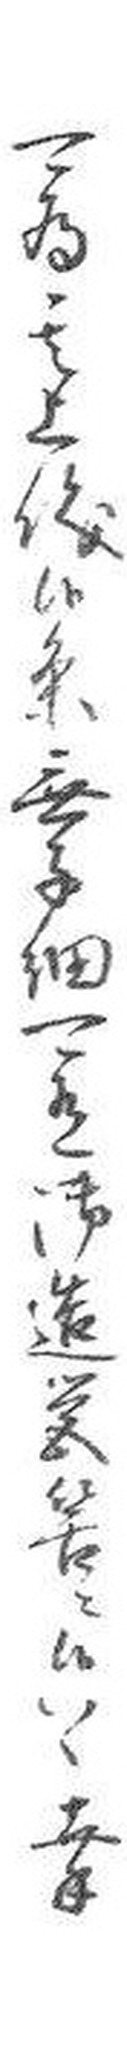可為其上儀候条無子細可有御造営筈ニ候ハゝ幸
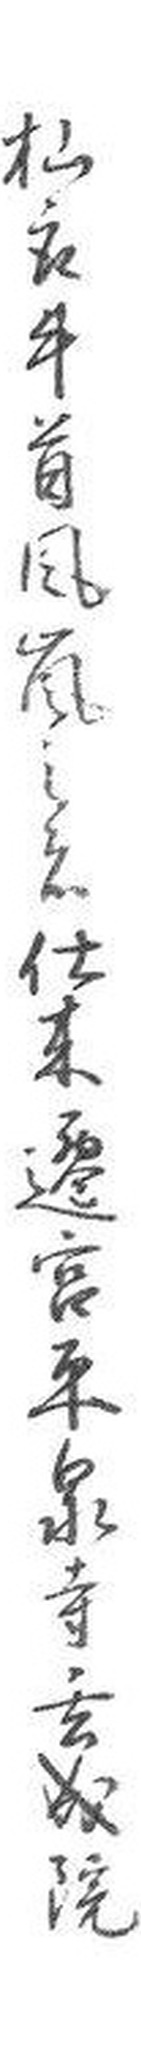杣取牛首風嵐之者仕来遷宮平泉寺玄成院
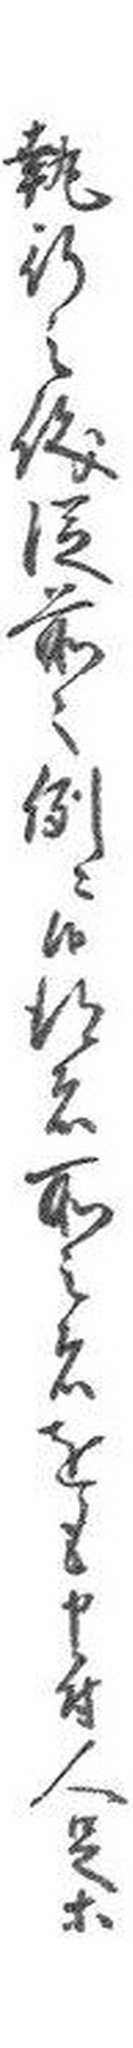執行之儀従前々例ニ候得者所之者をも申付人足等
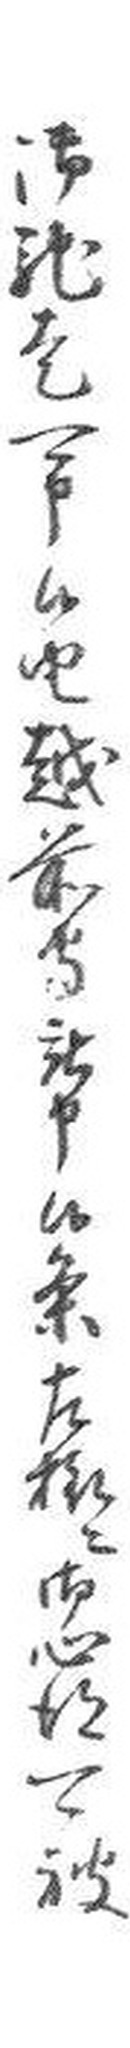御馳走可申候由越前守被申候条左様ニ御心得可被
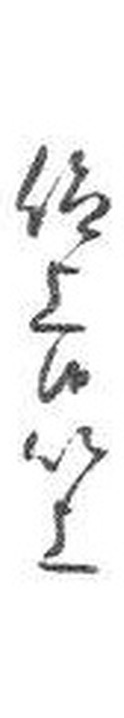仰上候以上
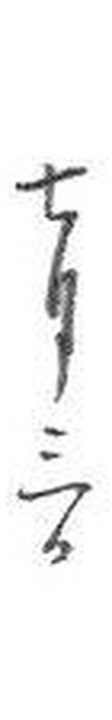七月三日
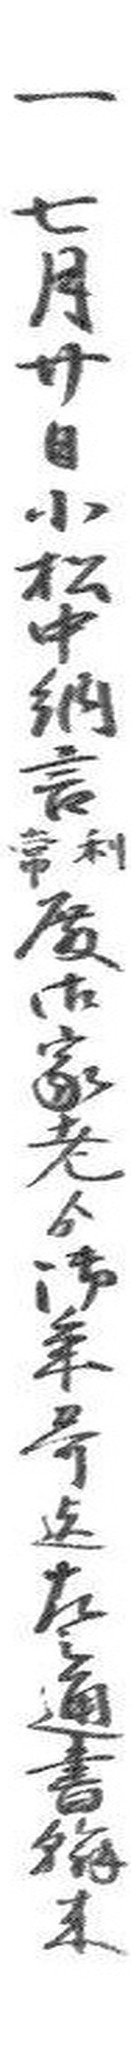一七月廿日小松中納言利常殿御家老ゟ御年寄迄左之通書翰来
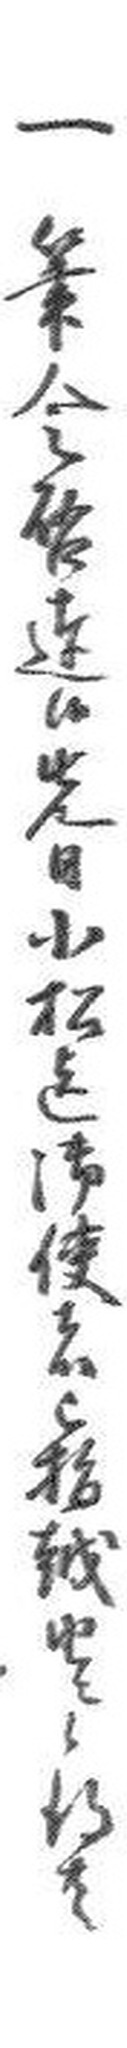一筆令啓達候先日小松迄御使者被指越由ニ候得共
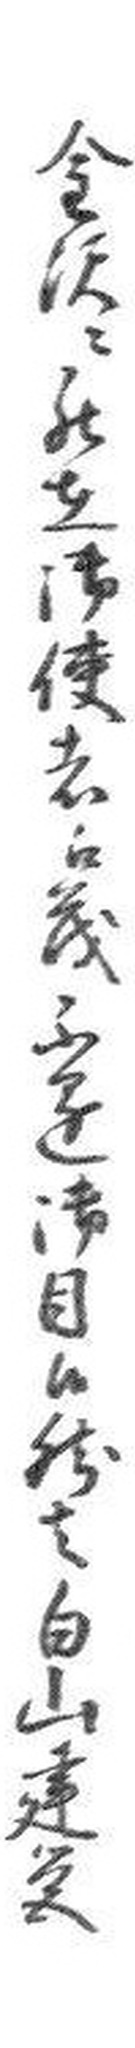金沢ニ罷在御使者江茂不懸御目候然者白山建営
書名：家譜 五 光通公 従寛永十三年到万治二年
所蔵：福井県文書館 Fukui Prefectural Archives
